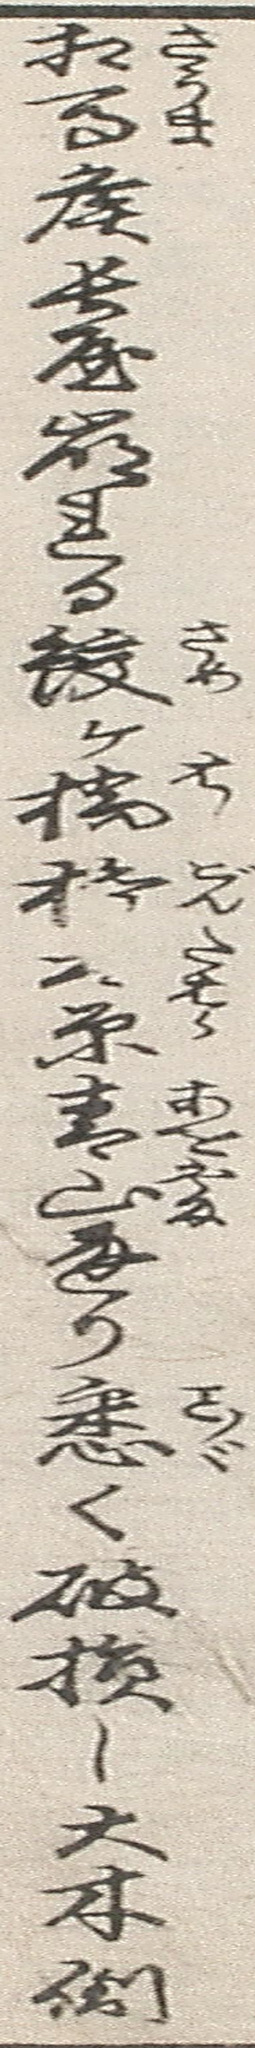相馬矦長屋崩れる鮫ヶ橋権田原青山通り悉く破損し大木倒
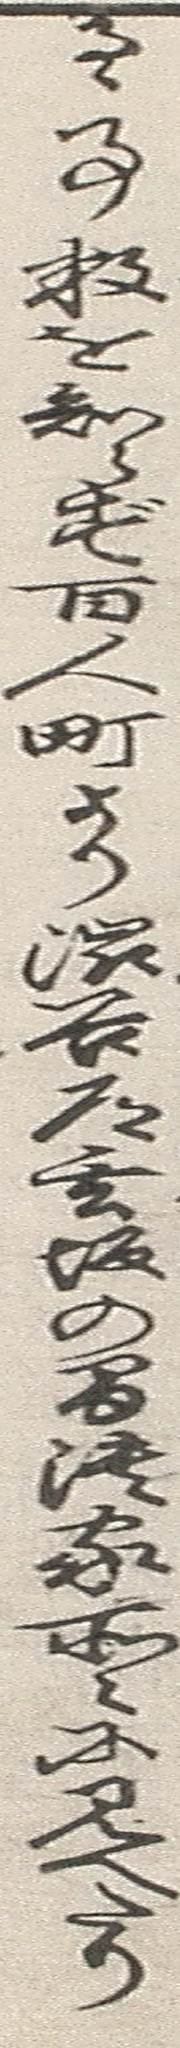るゝ事数を知らず百人町より渋谷道玄坂の間潰家所々に見へたり
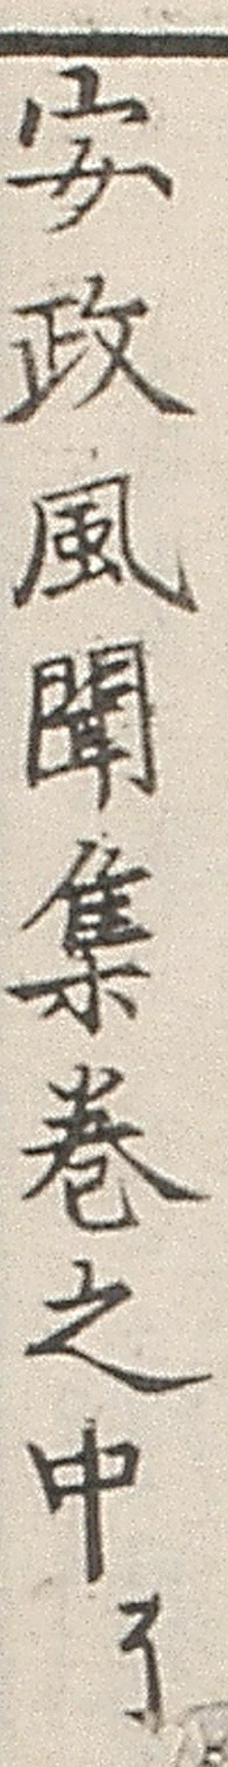安政風聞集巻之中了

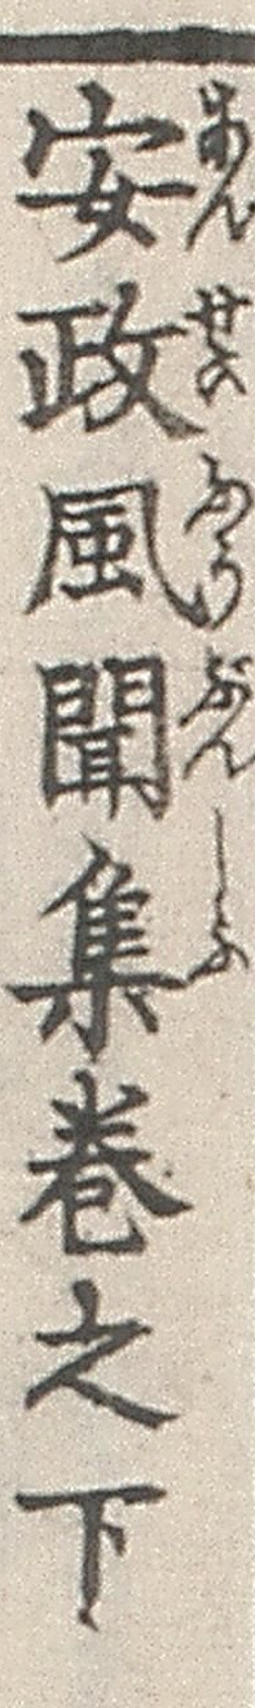安政風聞集巻之下
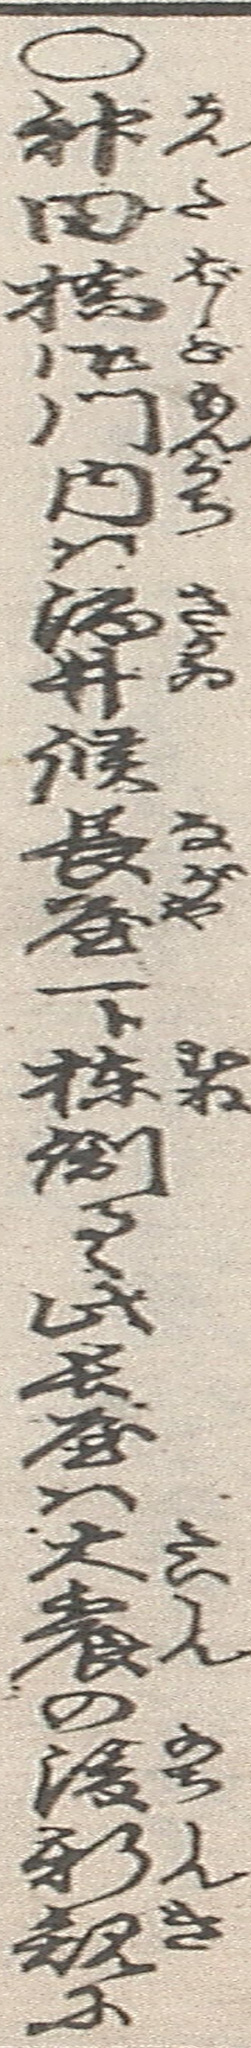◯神田橋門内ハ酒井矦長屋一ト棟倒るゝ此長屋ハ大震の後新規に
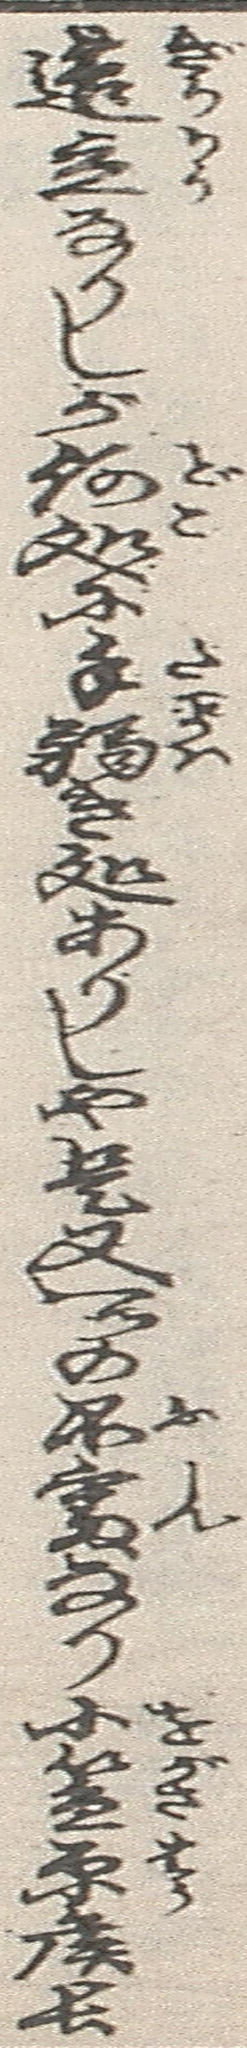造立なりしが何処に手弱き処ありしや是又一ッの不審なり小笠原矦長
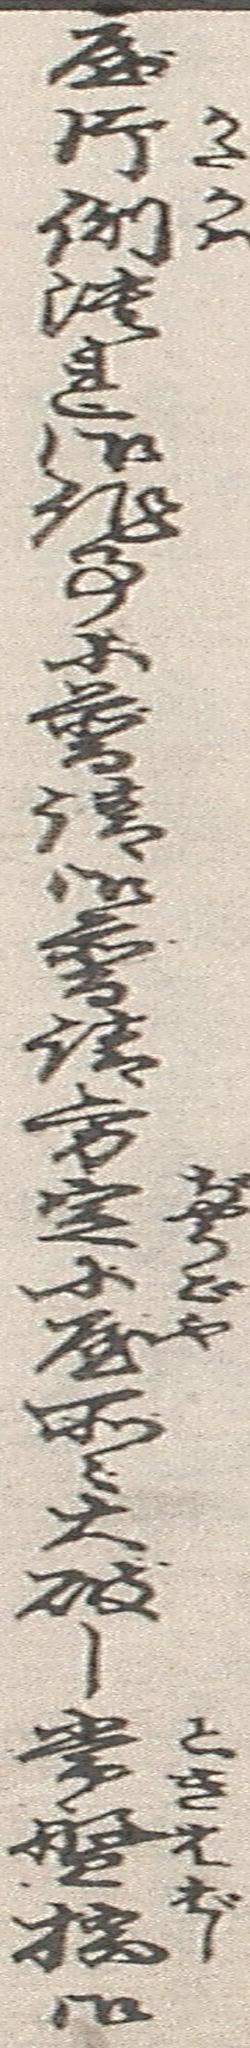屋片側潰れ御作事に普請御普請方定小屋所々大破し常盤橋御
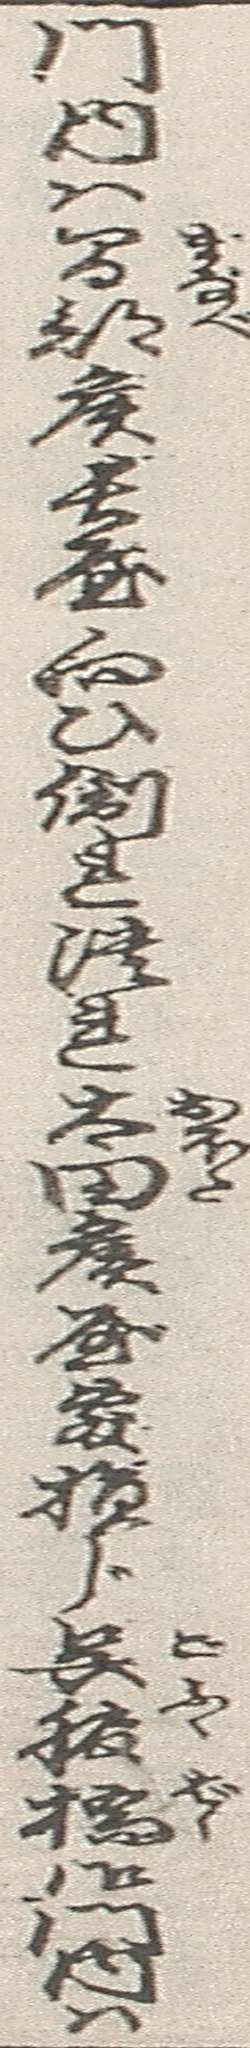門内ハ間部矦長屋向ひ倒れ潰れ大田矦屋敷損じ呉服橋御門内ハ
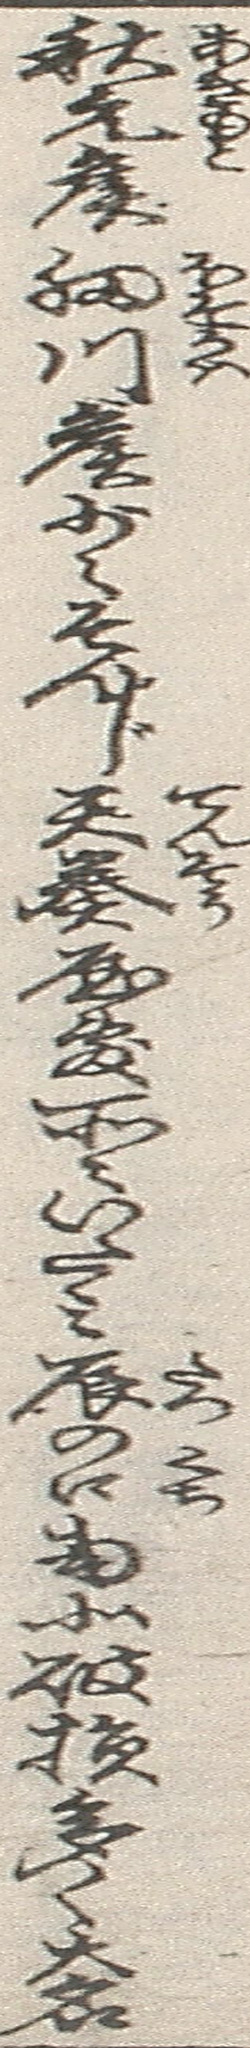秋元矦細川矦少々そんじ天奏屋敷所々いたミ辰の口南北破損多く大名
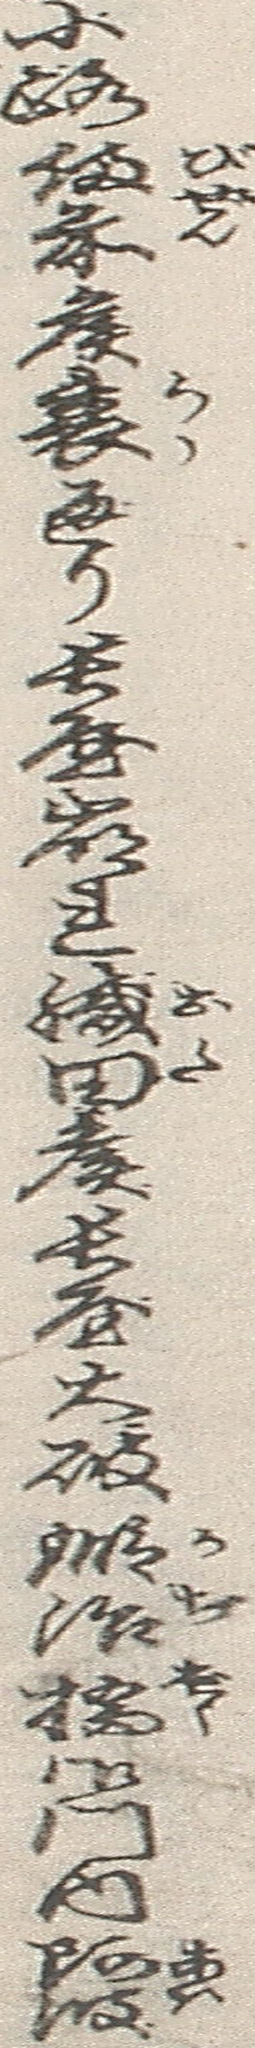小路備前矦裏通り長屋崩れ織田矦長屋大破鍛冶橋御門内阿波
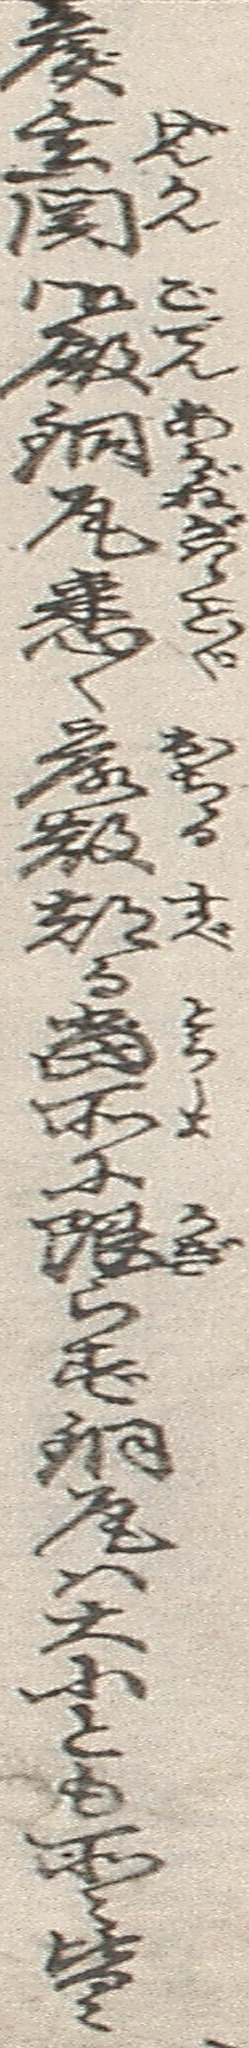矦玄関御殿銅瓦悉く落散都而当所に限らず銅瓦ハ大小とも所々皆々
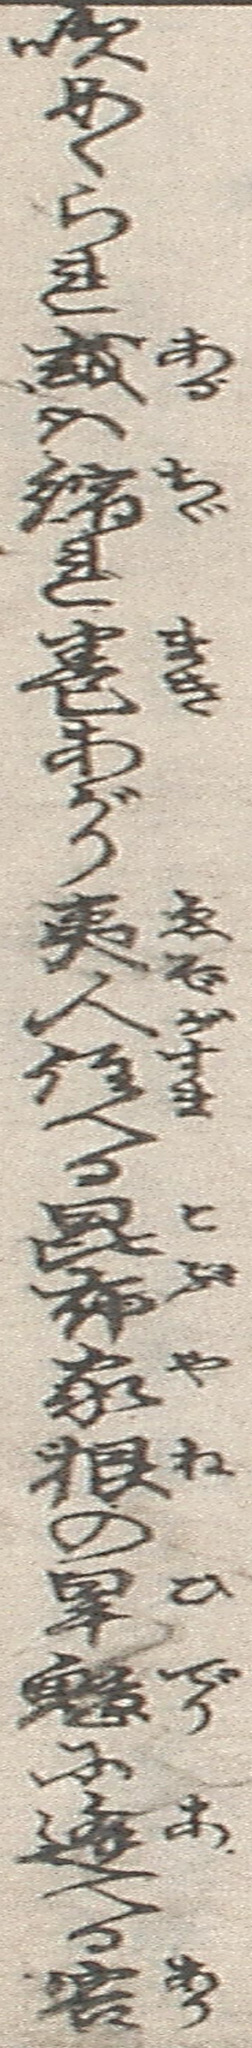吹めくられ或ハ縮れ巻あがり夷人住へる昆布家根の旱魃に逢へる容
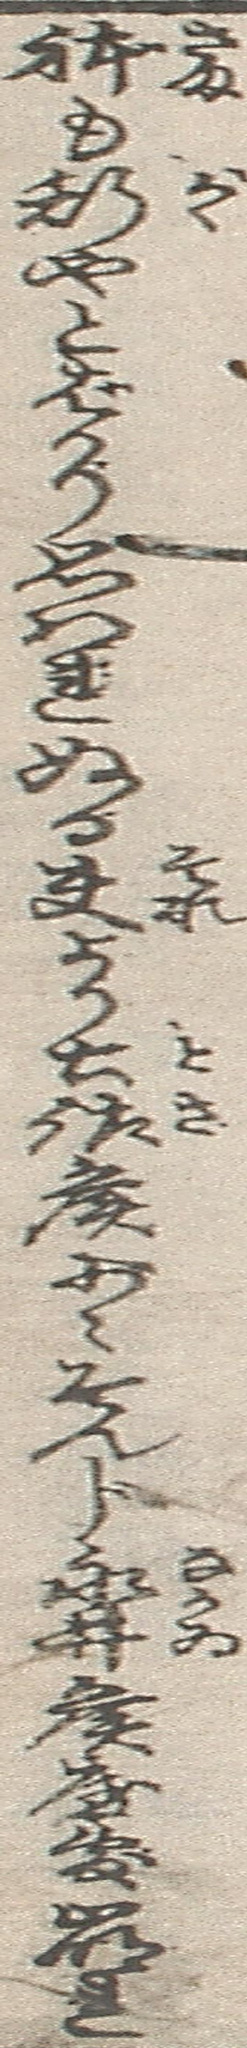体も斯やとばかり思ハれぬる夫より土佐矦少々そんじ永井矦屋敷崩れ

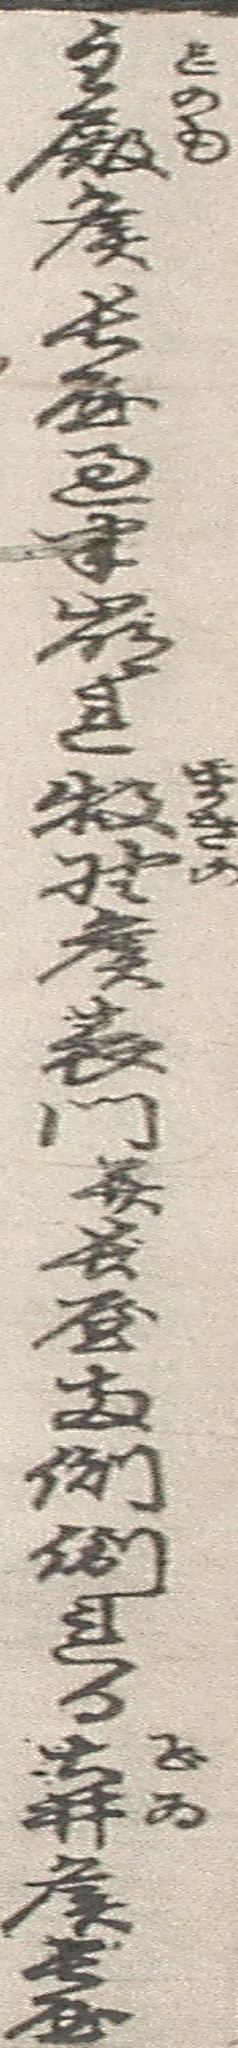主殿矦長屋過半崩れ牧野矦表門并長屋両側倒れる土井矦長屋
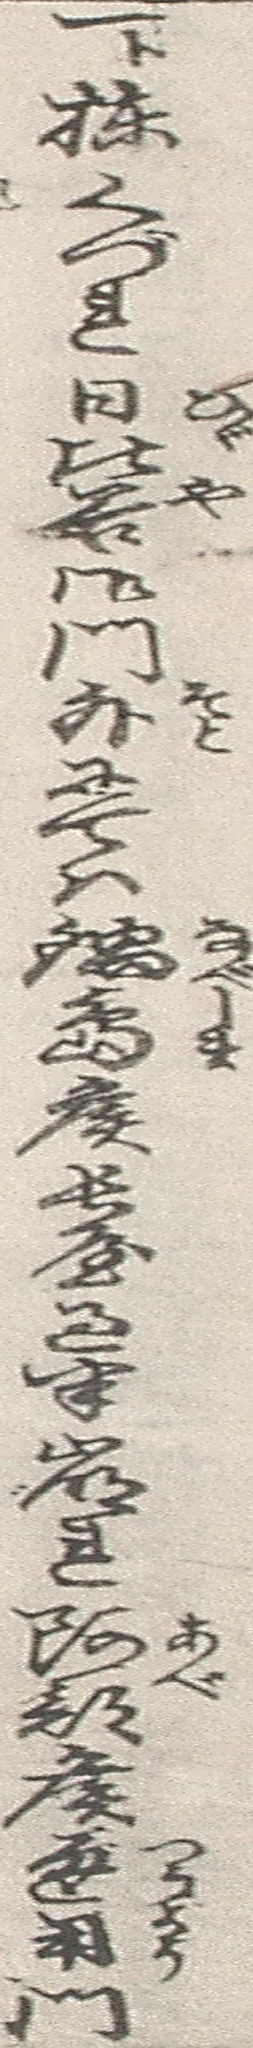一ト棟くづれ日比谷御門外にてハ鍋嶋矦長屋過半崩れ阿部矦通用門
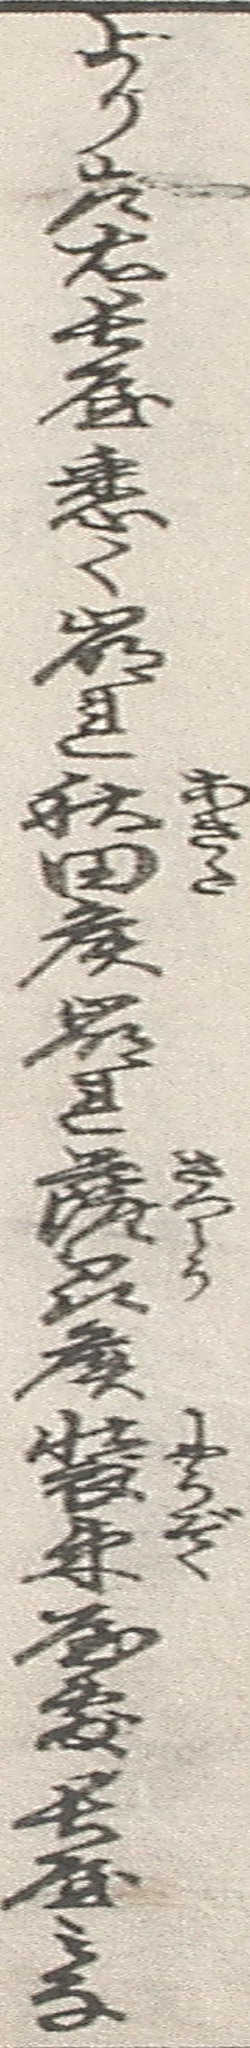より左右長屋悉く崩れ秋田矦崩れ薩州矦装束屋敷長屋ミな
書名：安政風聞集　上中下　全
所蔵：東京大学地震研究所図書室 Earthquake Research Institute Library, The University of Tokyo, JAPAN
